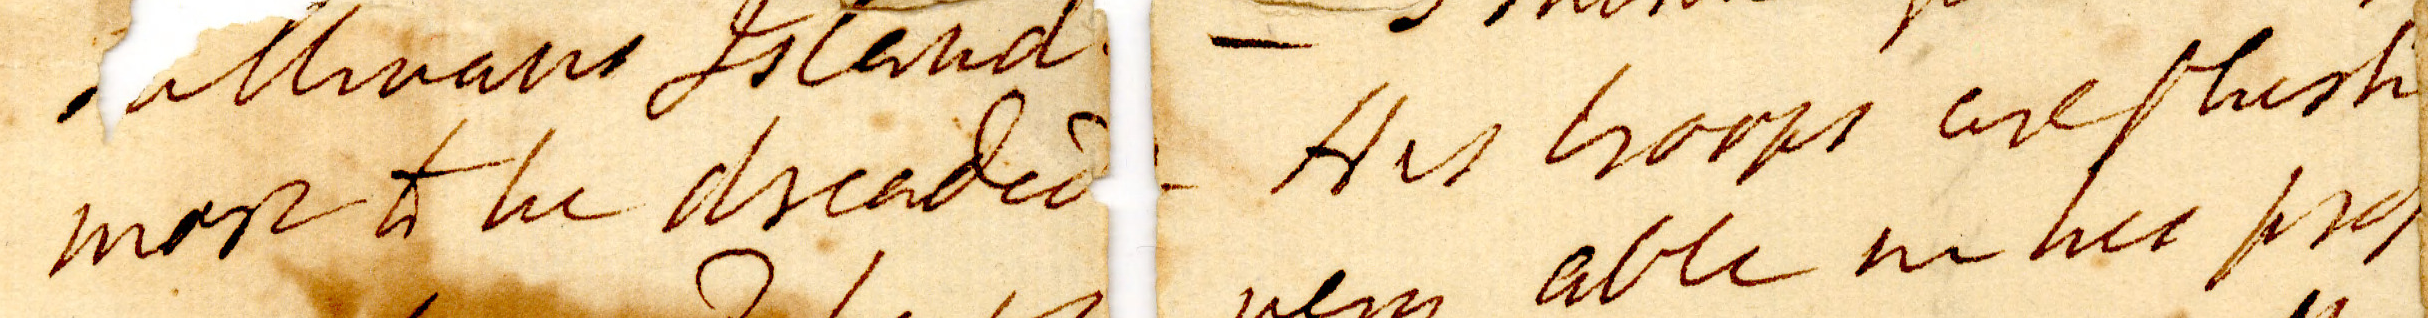more to be dreaded. His troops are hist
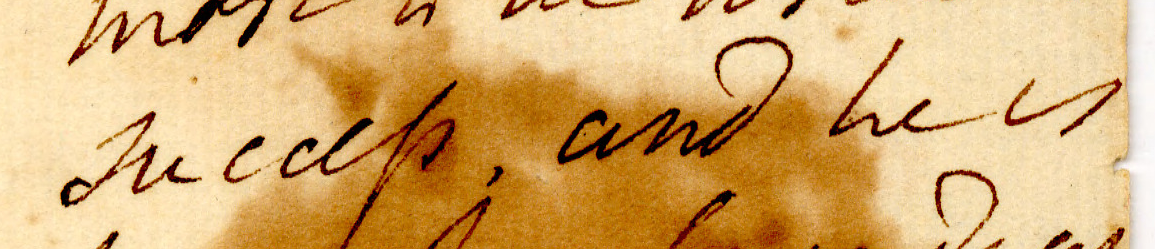success, and he is
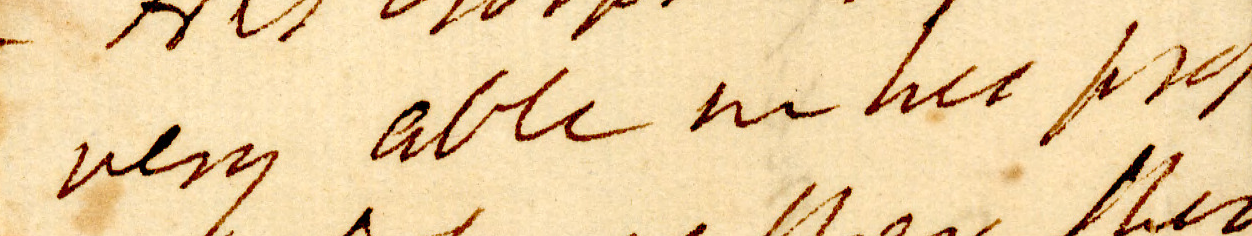very able in his pr
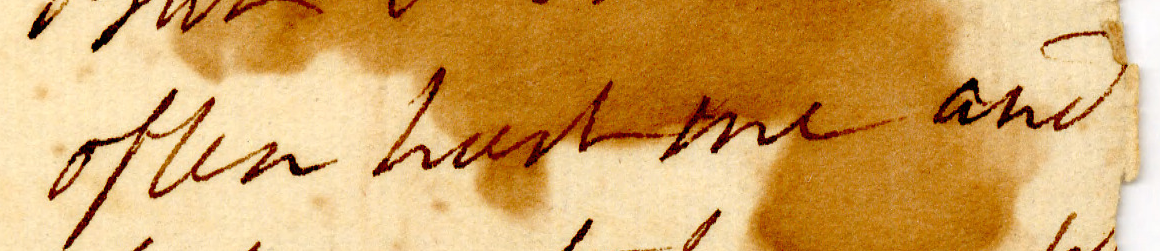often hurt me and
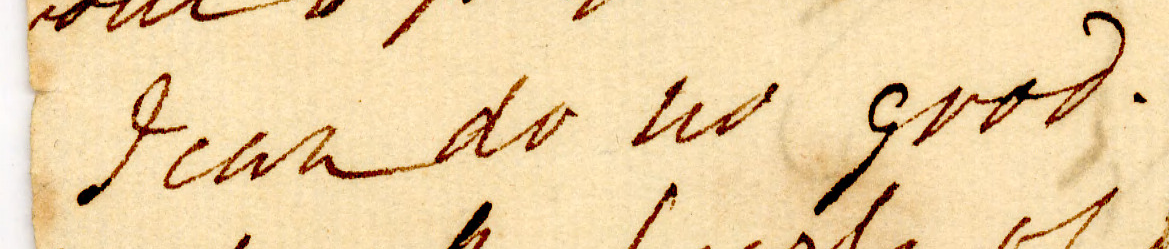I can do no good
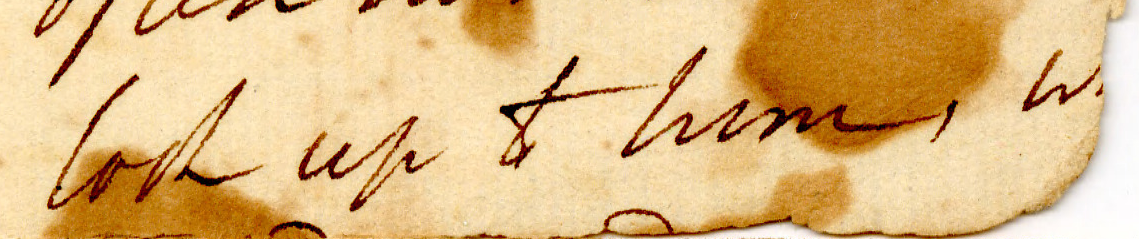look up to him, w
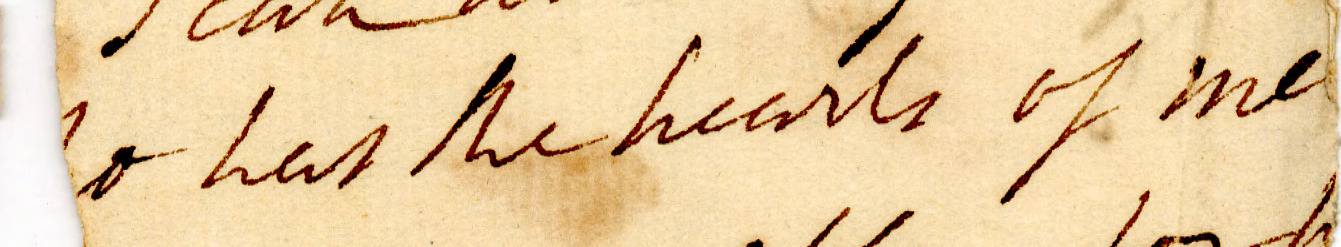o has the hearts of me
